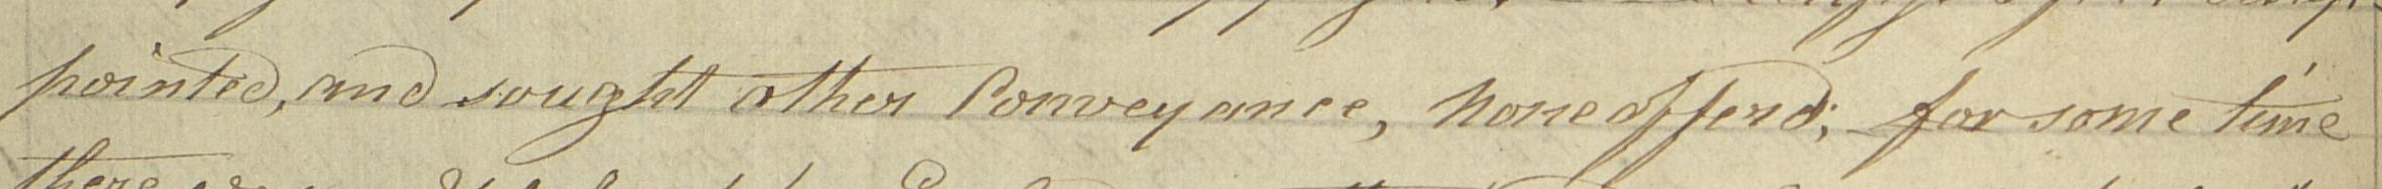pointed, and sought other Conveyance, none offerd; for some time
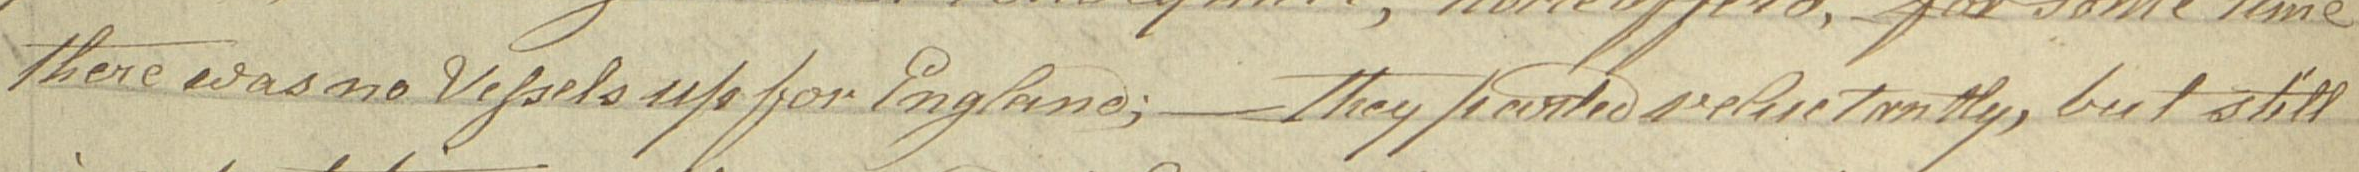there was no Vessels up for England; They parted reluctantly, but still
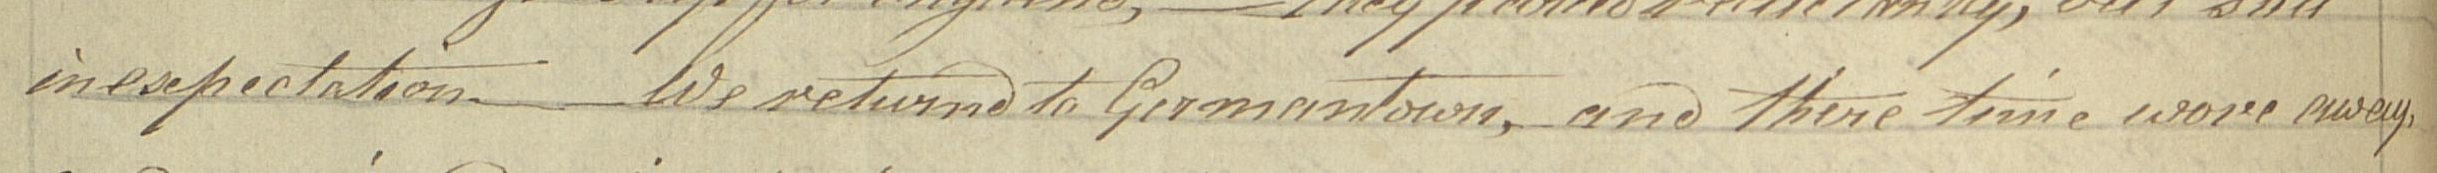in expectation. We returnd to Germantown and there time wore away,
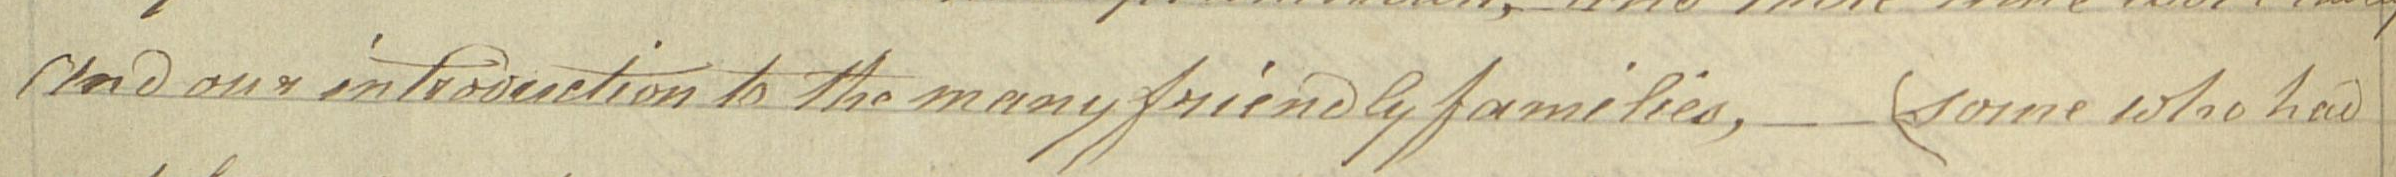and our introduction to the many friendly families, (Some who had
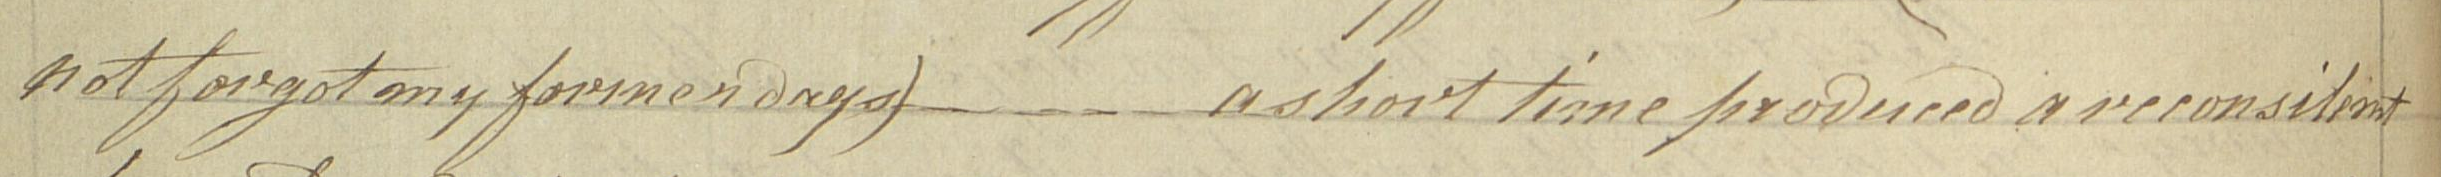not forgot my former days) a short time produced a reconsilent
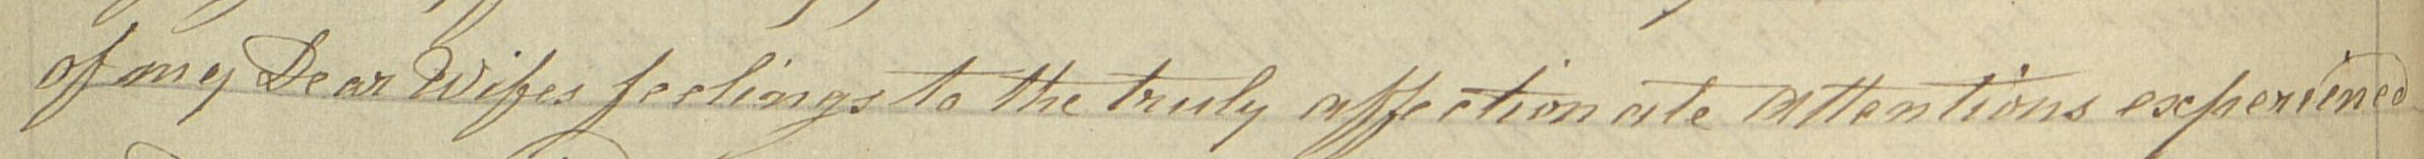of my Dear Wishes feelings to the truly affectionate attentions experiencd
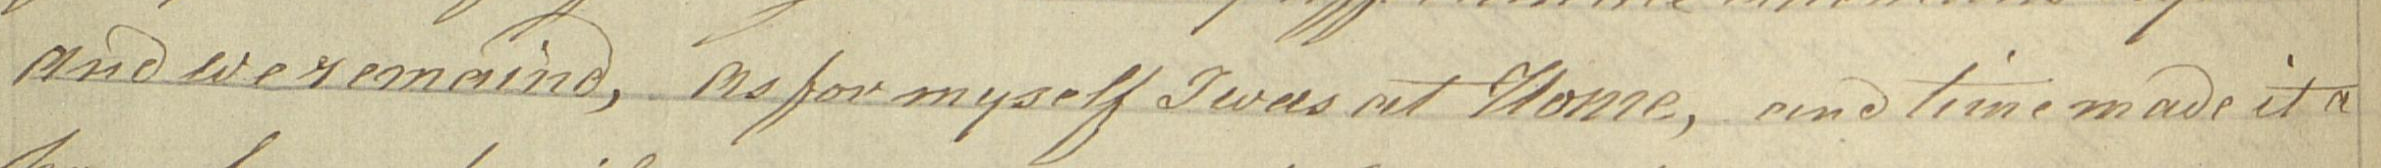And We remained, as for myself I was at Home, and time made it a
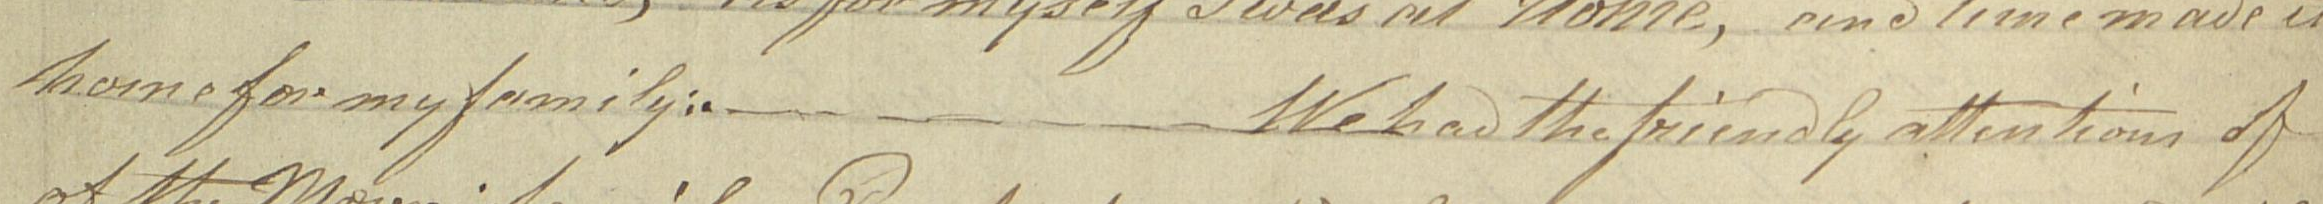home for my family. We had the friendly attentions of
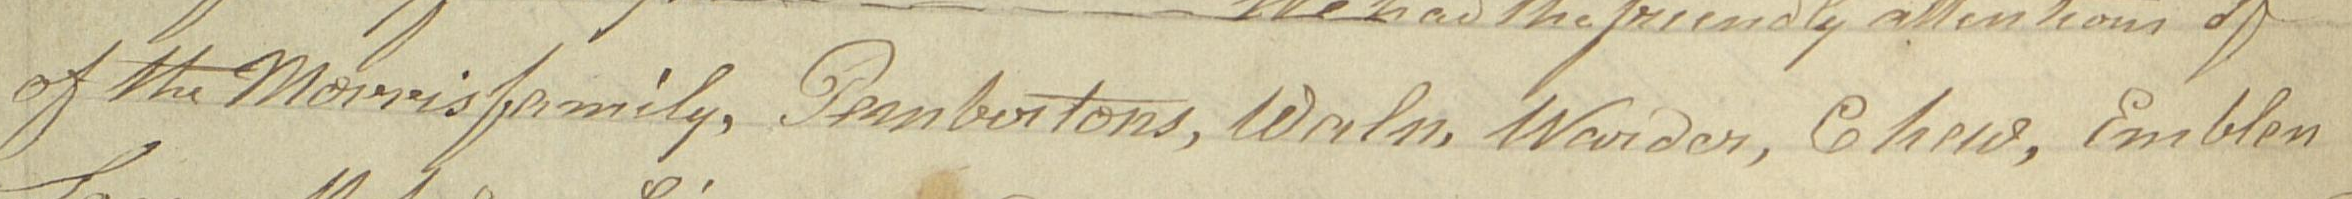of the Morris family, Pembertons, Waln. Warder, Chew, Emblen
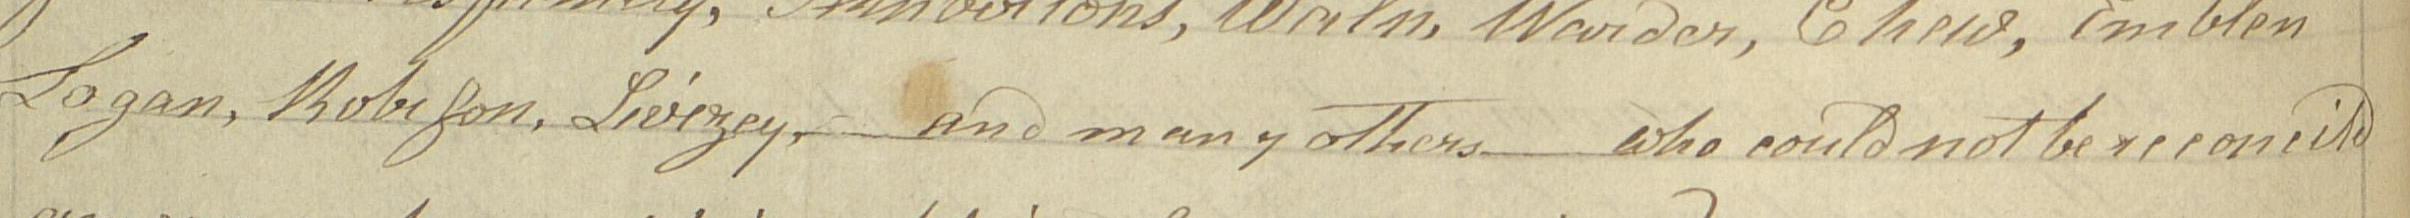Logan, Robeson, Livezey, and many others who could not be reconcild
